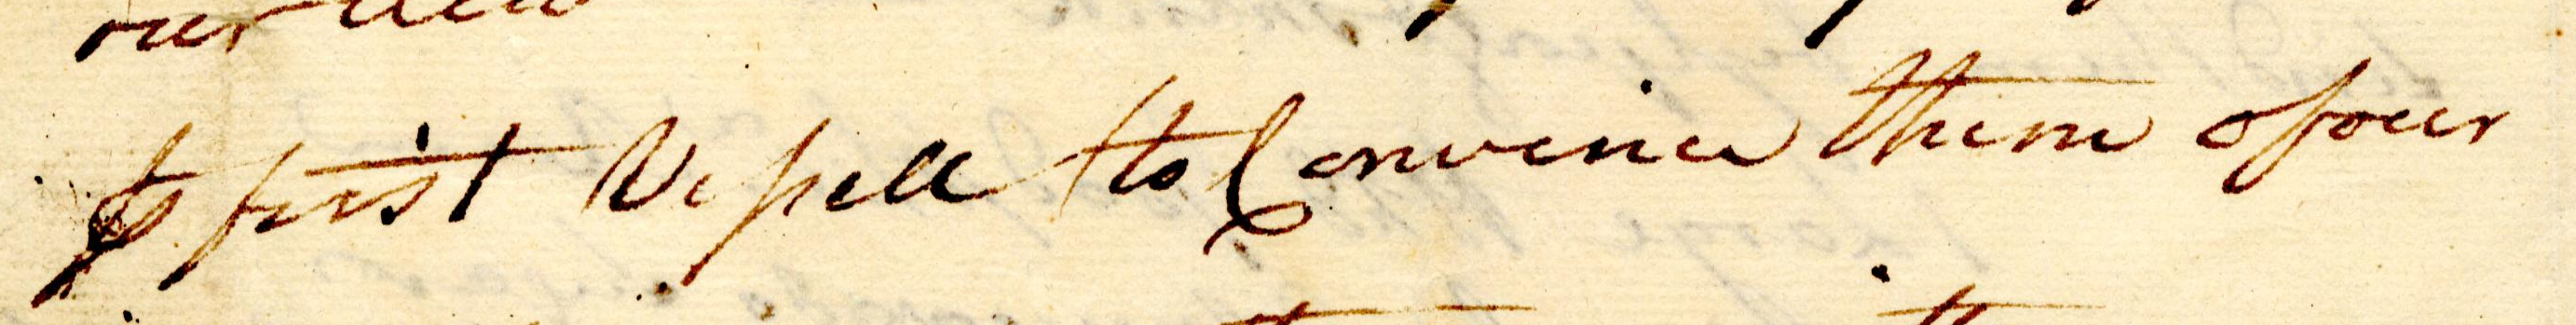& first we have (to Convince them of our
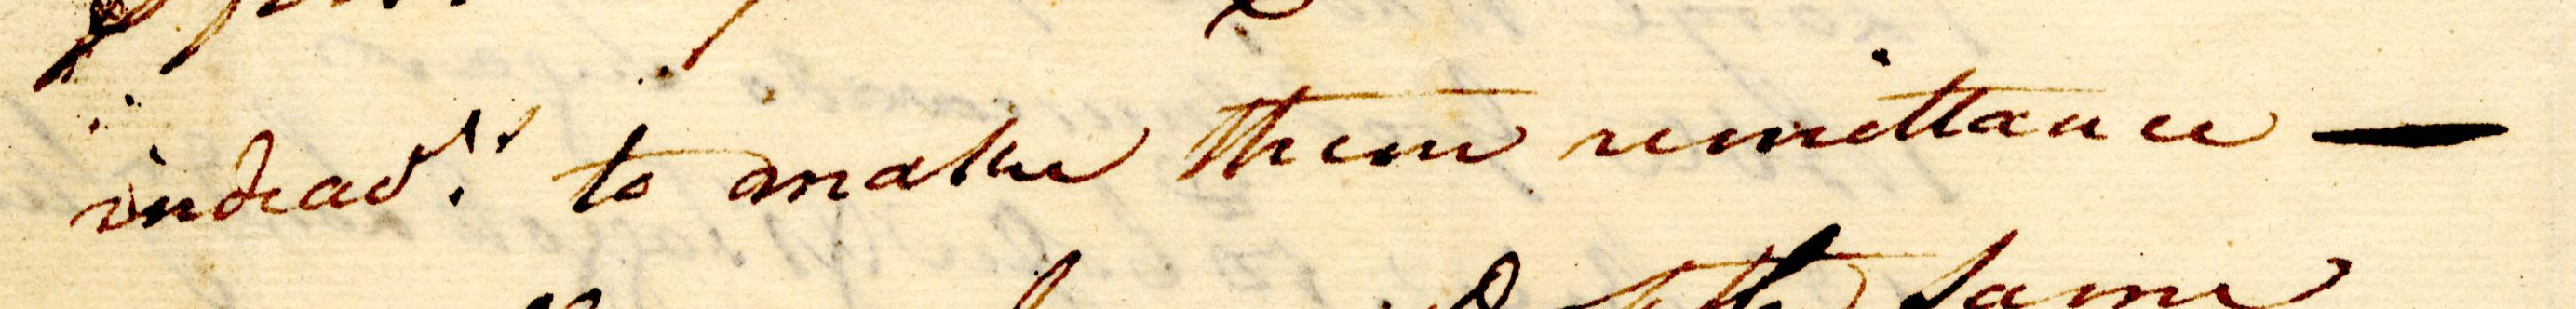indeav^r. to make them remittance-
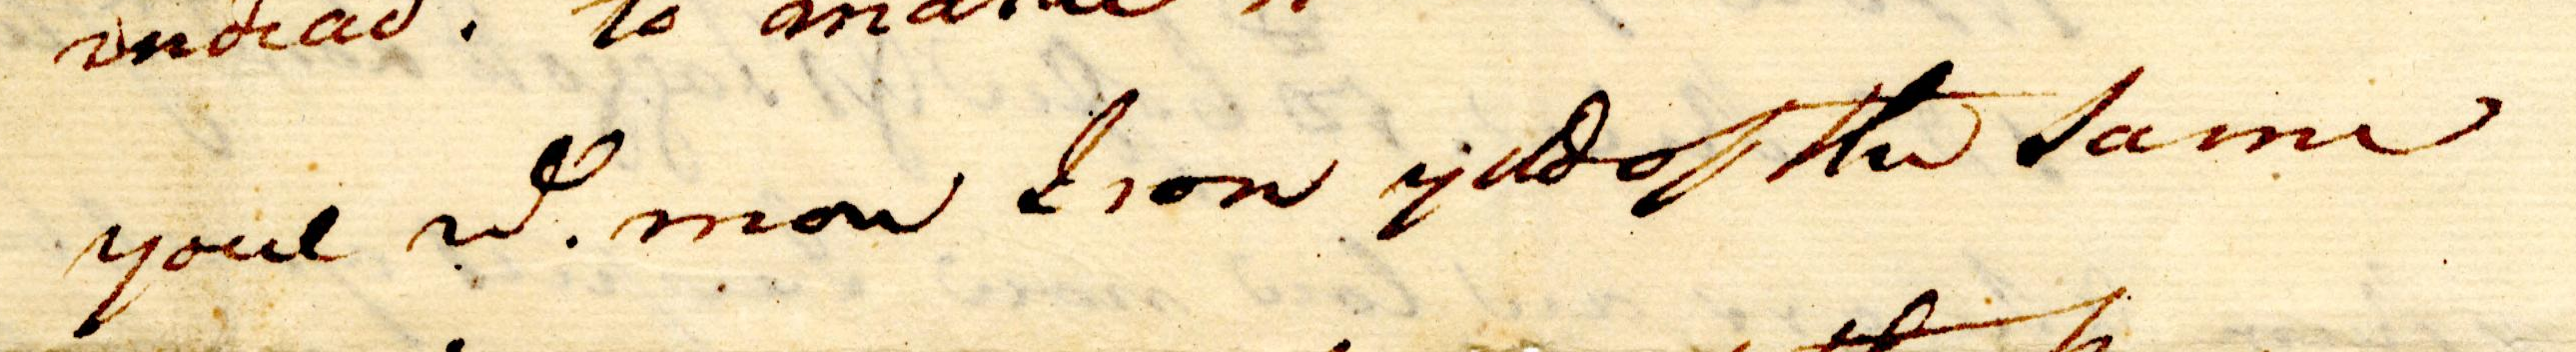youl re^e. more Iron yield of the Same
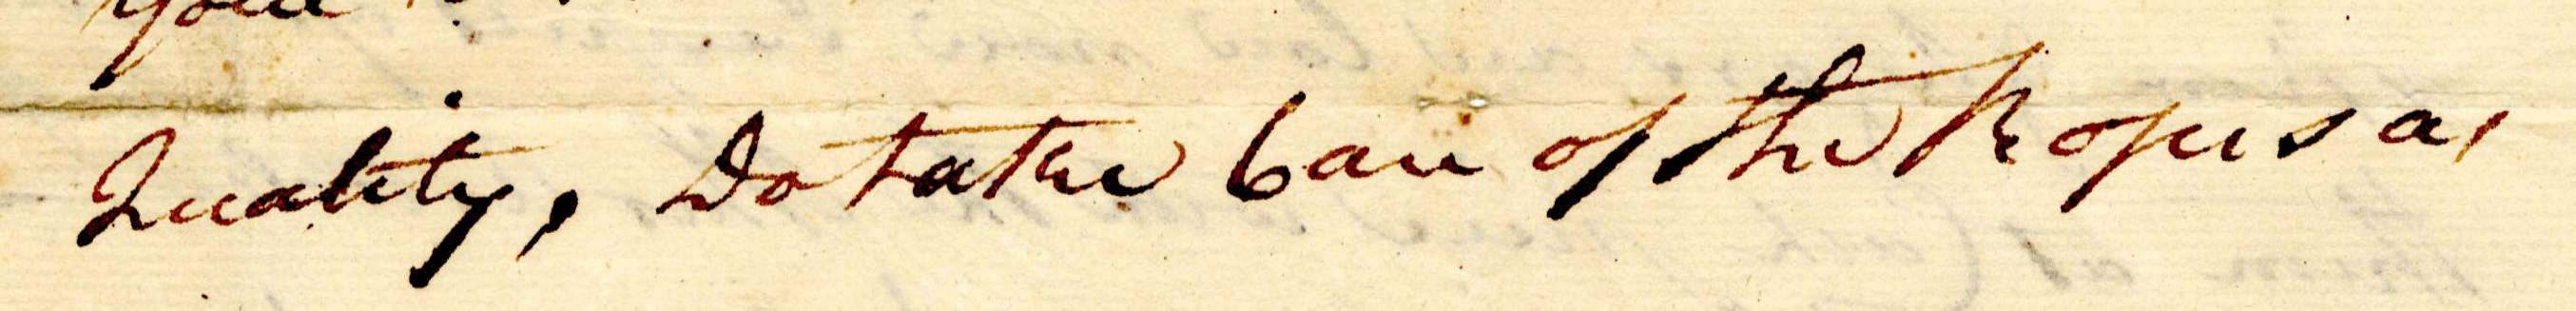Quality, so take Care of the Ropes as
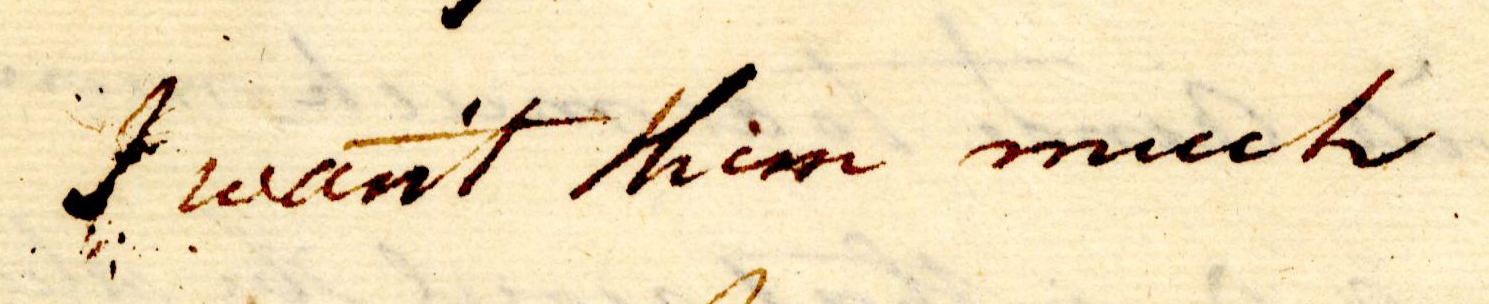I want them much
